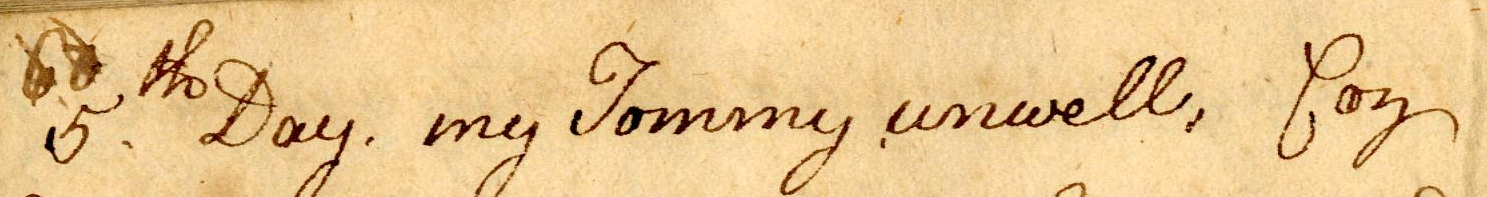5^th Day. my Tommy unwell, Coz
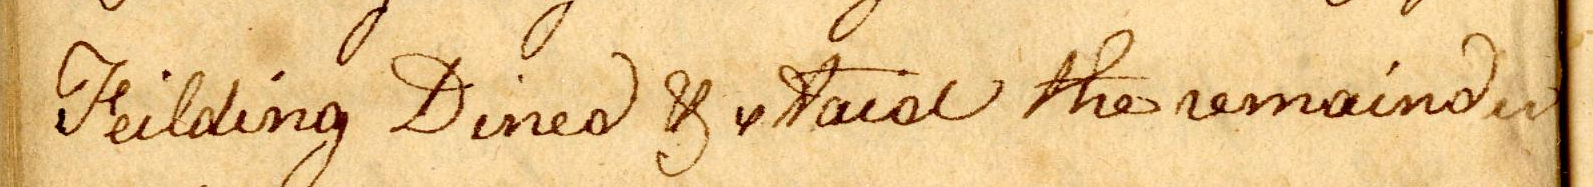Feilding Dined & staid the remainder
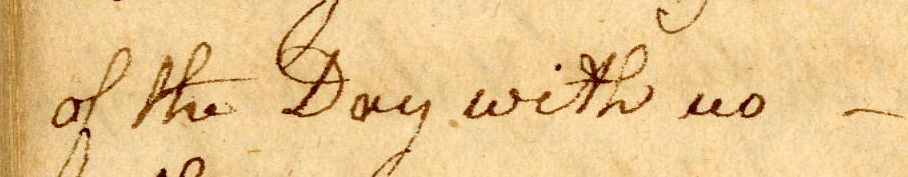of the Day with us-
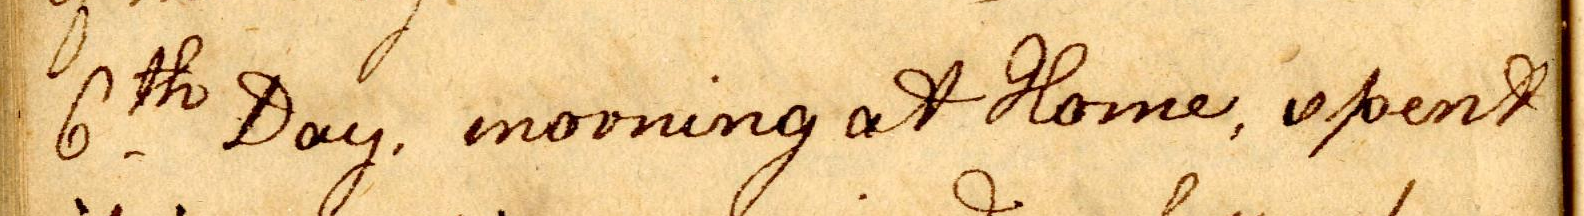6^th. Day. morning at Home, spent
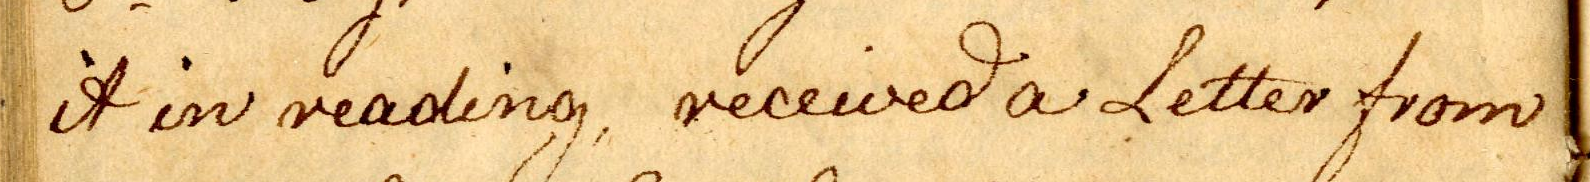it in reading, received a Letter from
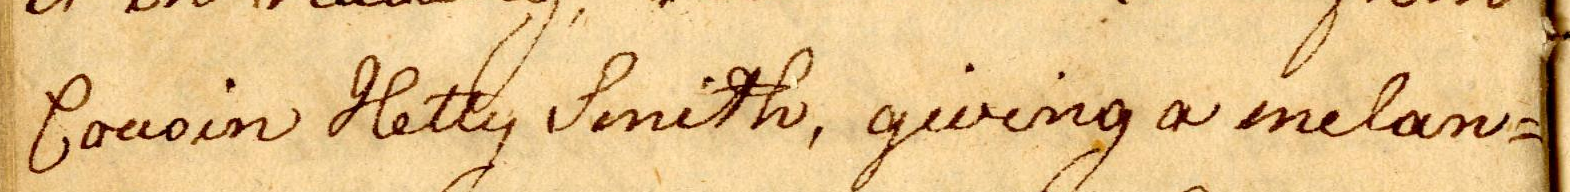Cousin Hetty Smith, giving a melan-
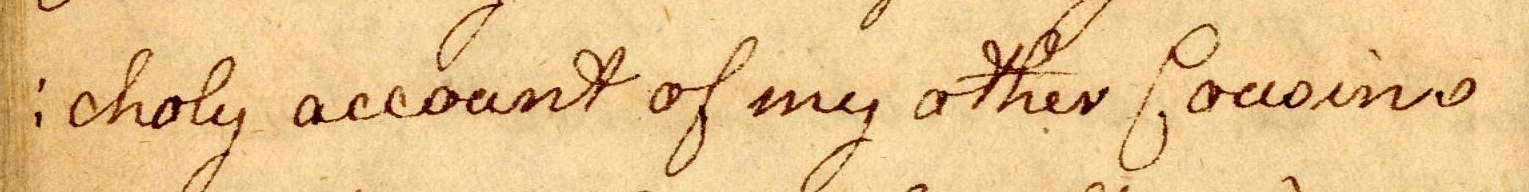-choly account of my other Cousins
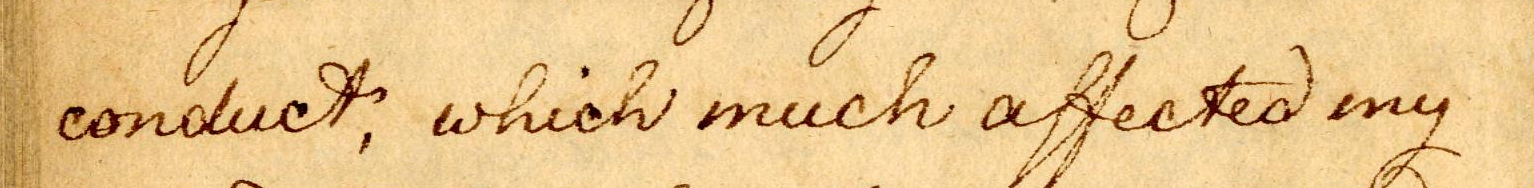conduct, which much affected my
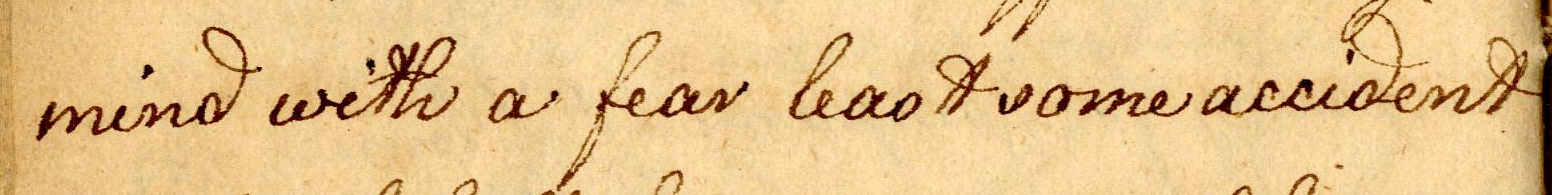mind with a fear least some accident
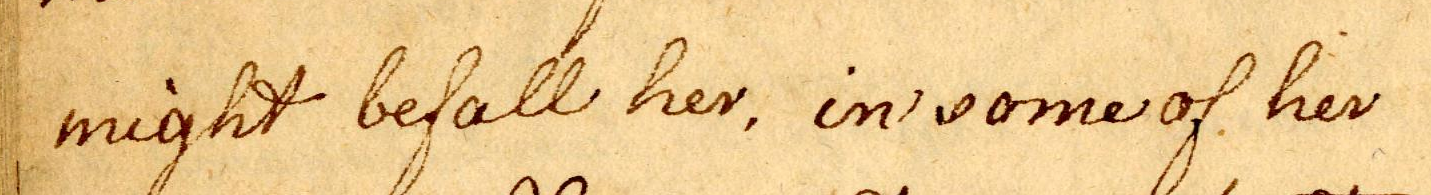might befall her, in some of her
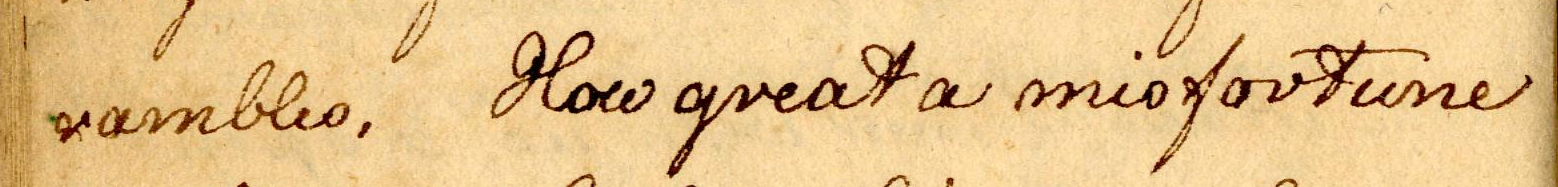rambles, How great a misfortune
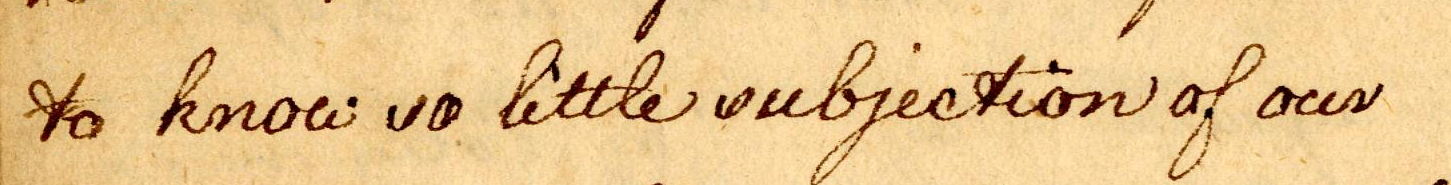to know so little subjection of our
